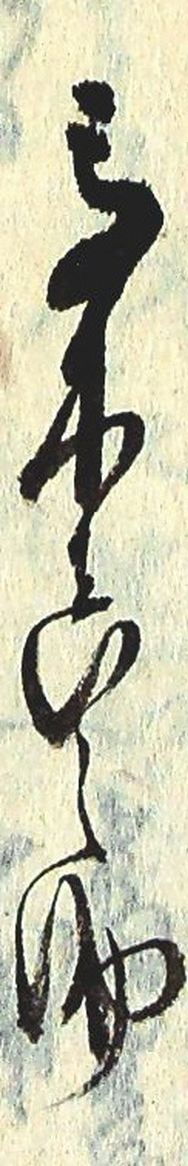高木真之助
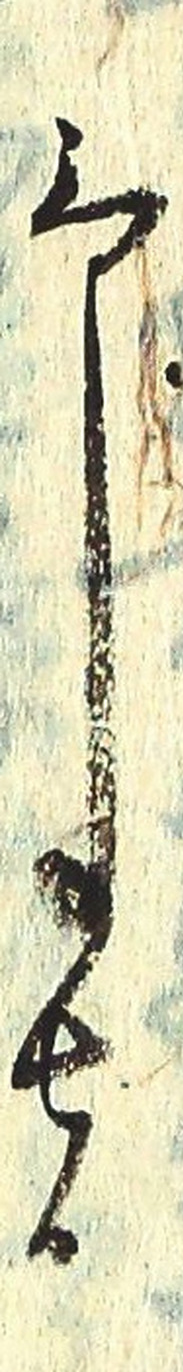三月七日
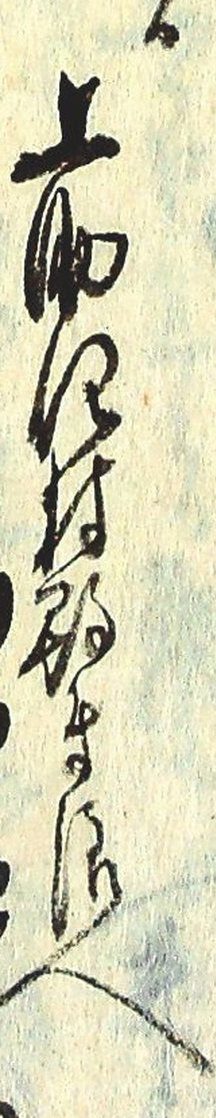上助任村郡付浪人
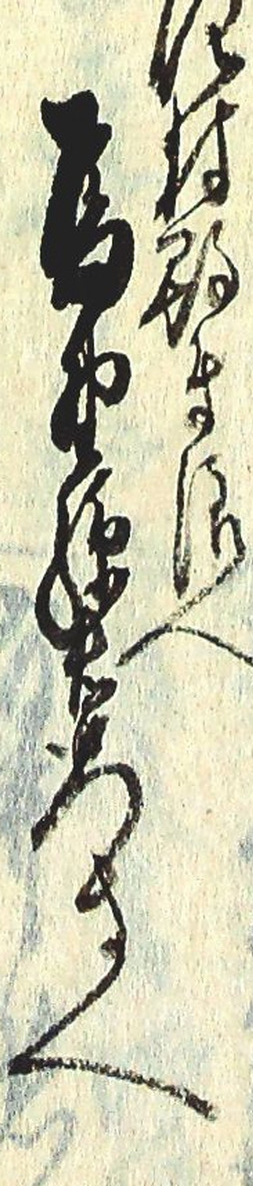鷹野孫右衛門方へ
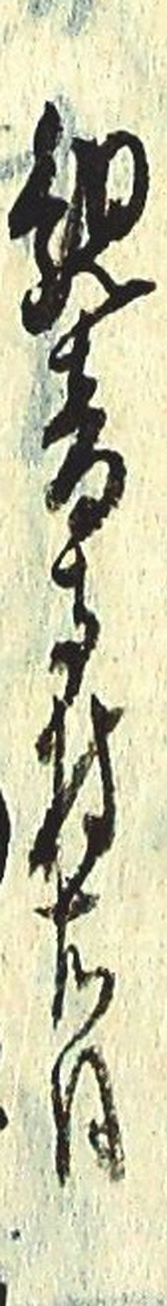観音寺村右同
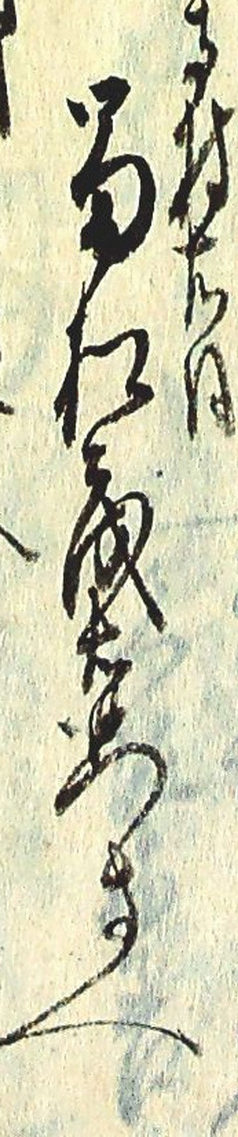冨松茂右衛門方へ
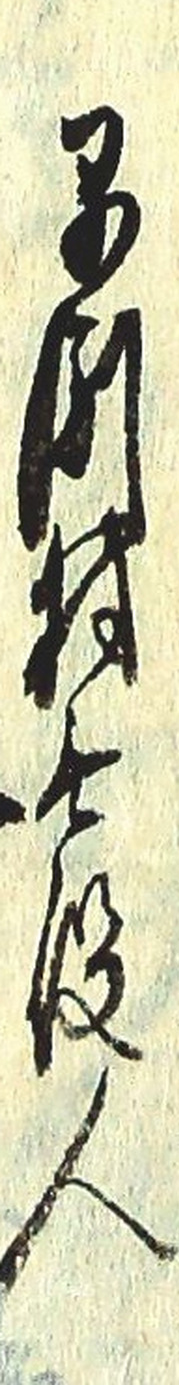早淵村無役人
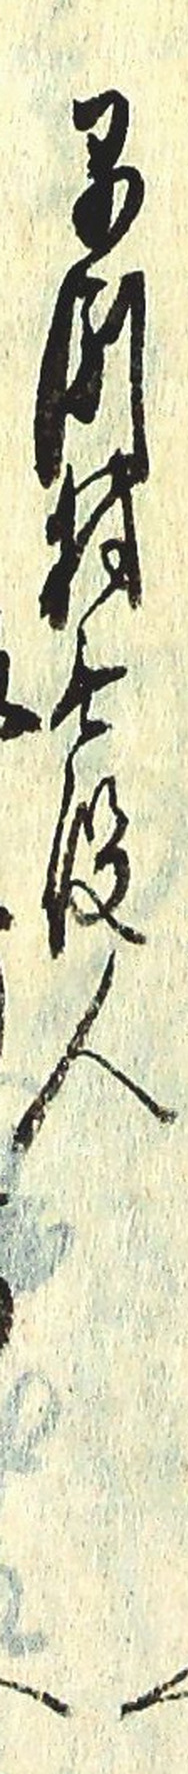早淵村無役人
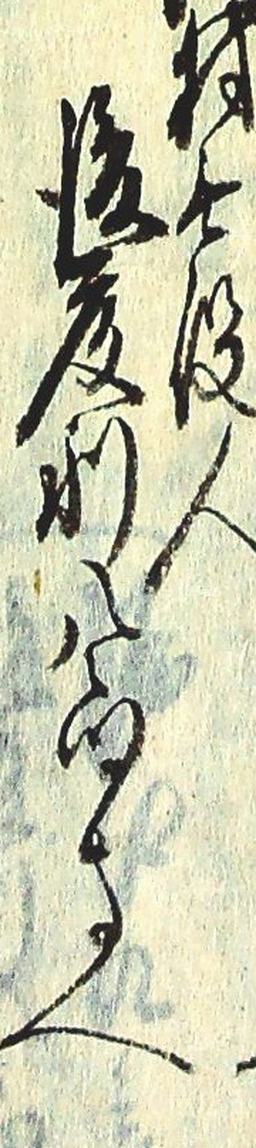後藤利八郎方へ
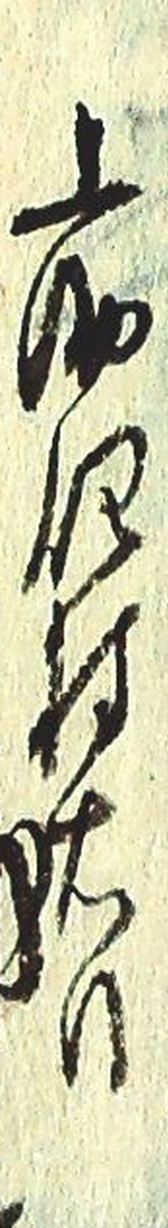上助任村右同
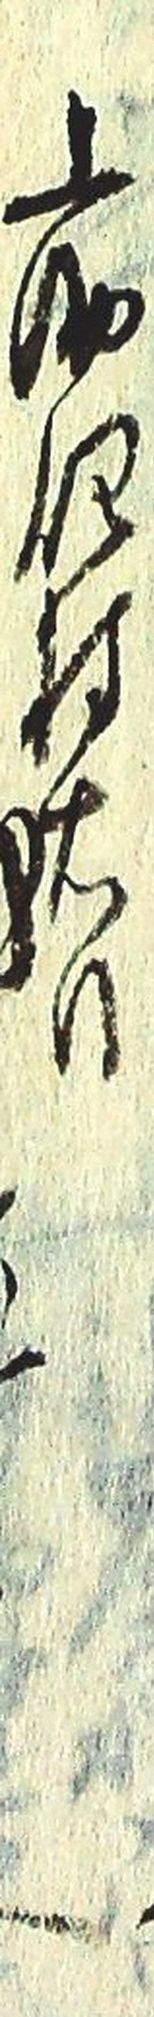上助任村右同
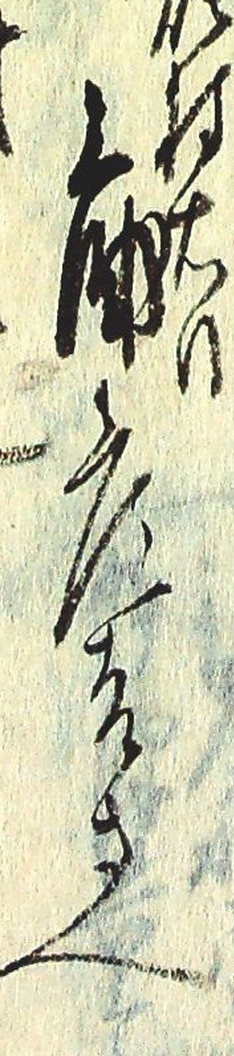三浦彦吉方へ
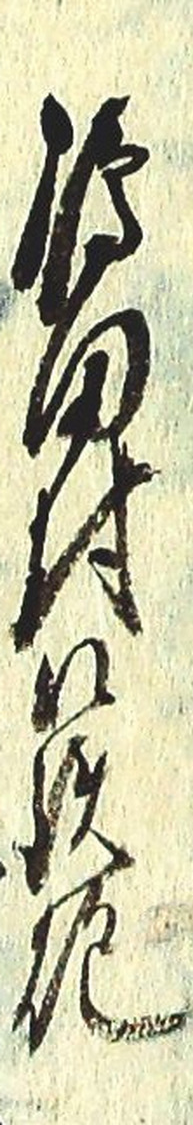島田村郷鉄炮
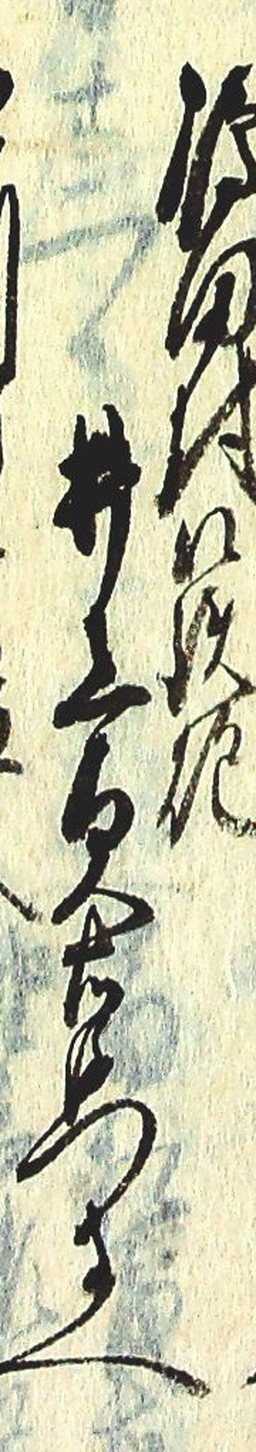井上貞右衛門方へ
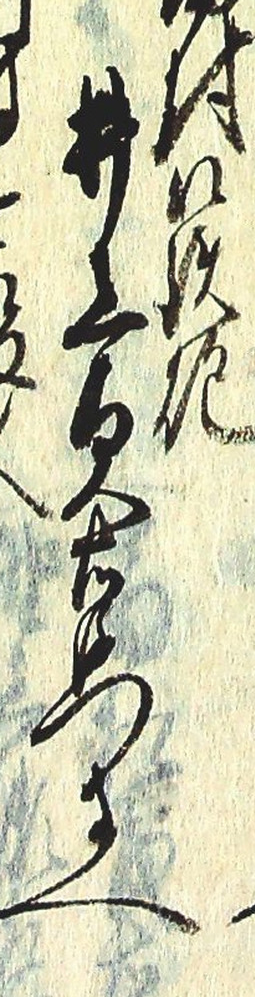井上貞右衛門方へ
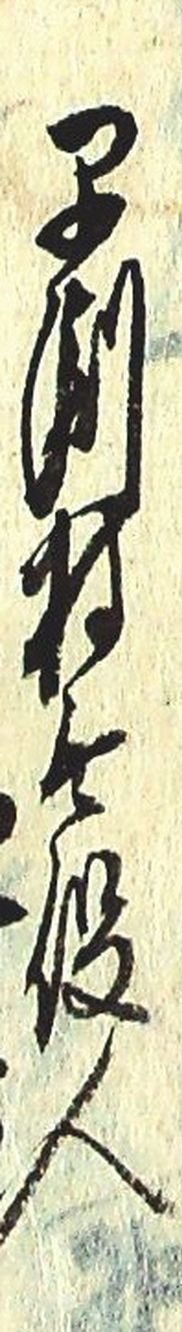早淵村無役人
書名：諸御願書控(弐番）
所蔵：鳴門教育大学 Naruto University of Education
